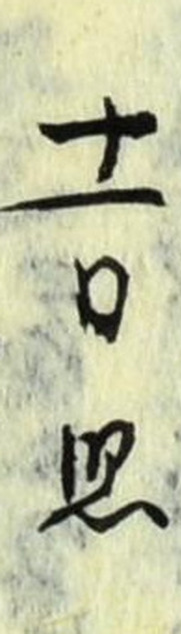十一日照
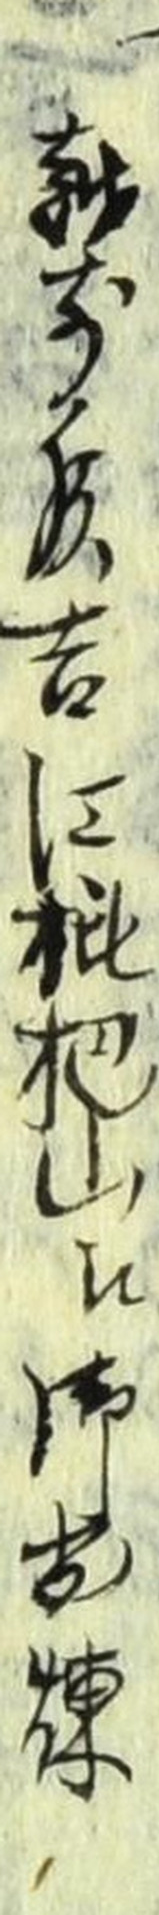越前侯吉江枇杷山え御出煉
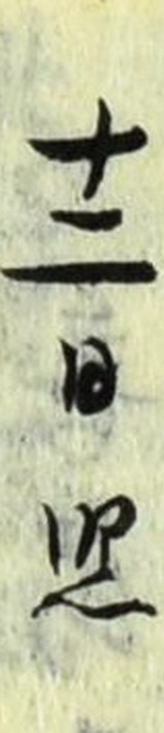十一日照
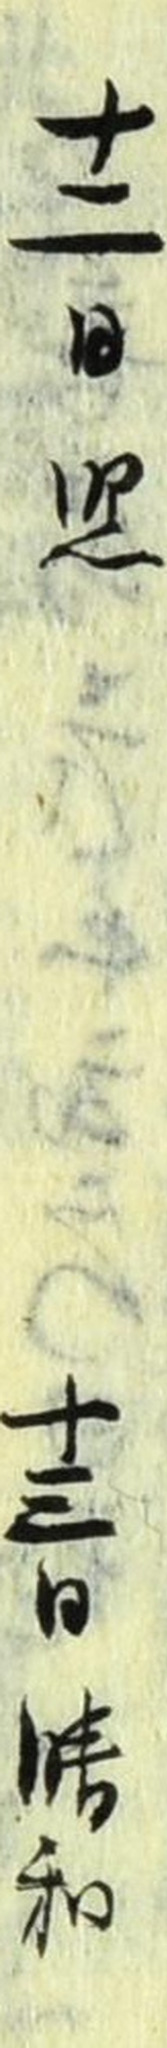十二日照十三日晴和
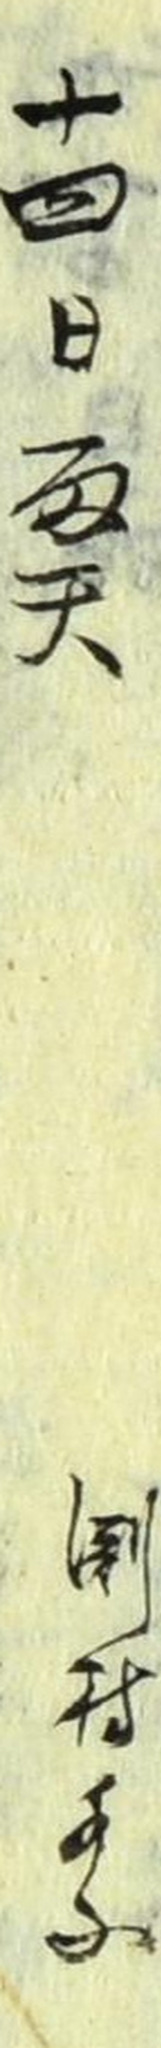十四日雨天淵村祭
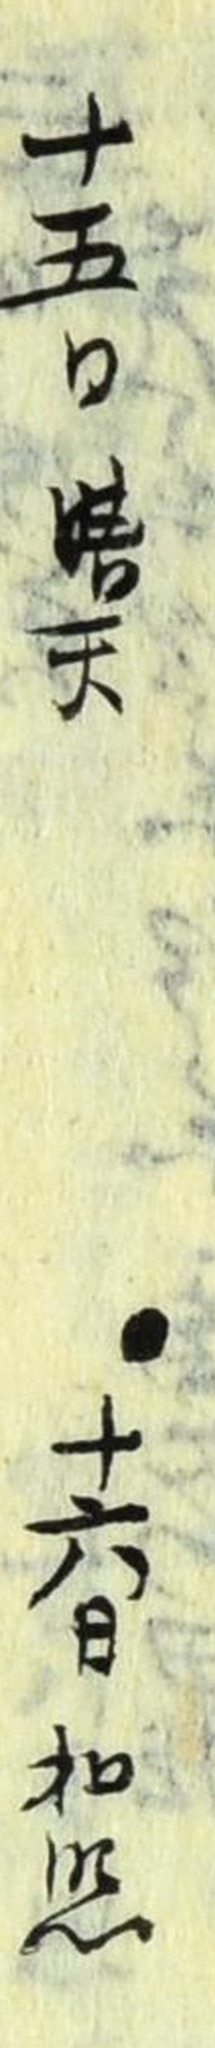十五日晴天●十六日和照
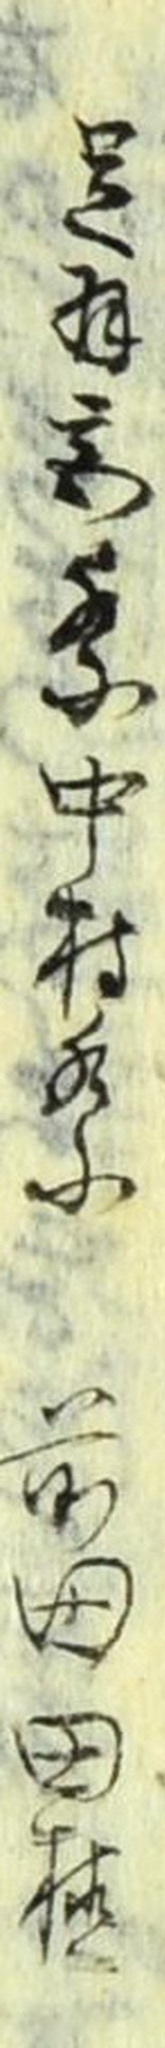足羽宮祭中村祭前田田植
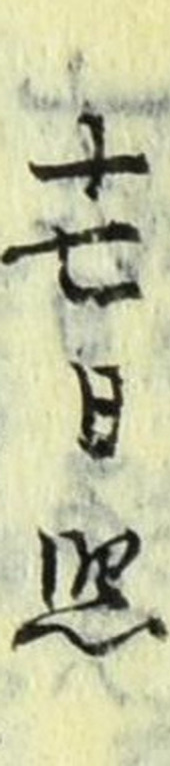十七日照
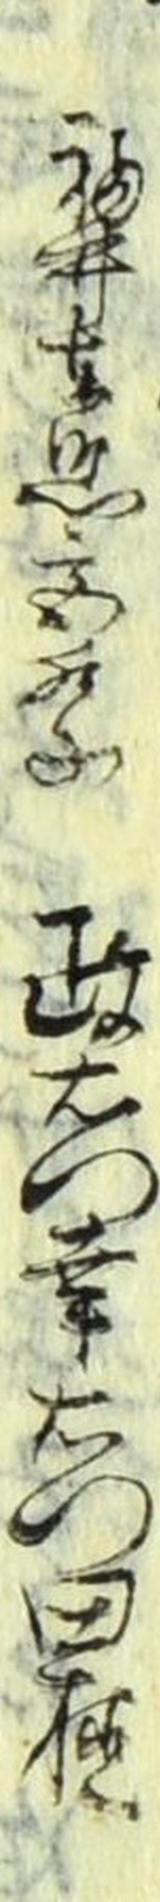福井東照宮祭政右衛門幸右衛門田植

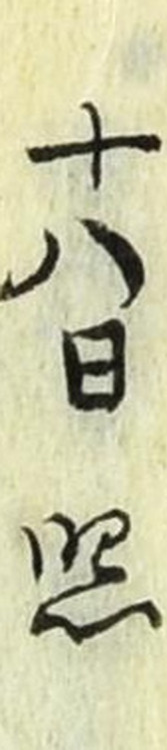十八日照
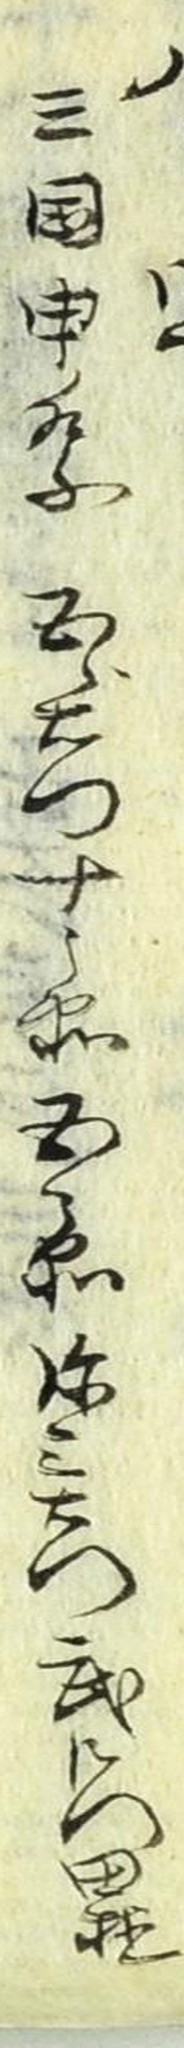三国申祭五郎右衛門十兵衛五兵衛弥三右衛門武左衛門田植
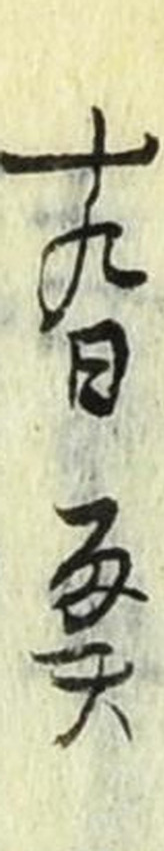十九日雨天
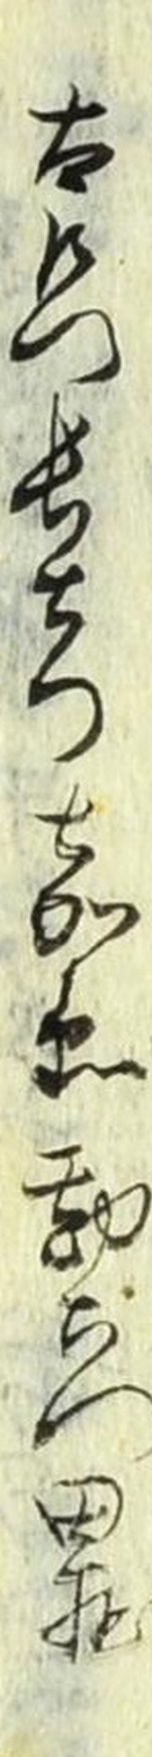太左衛門長右衛門嘉兵衛勘右衛門田植
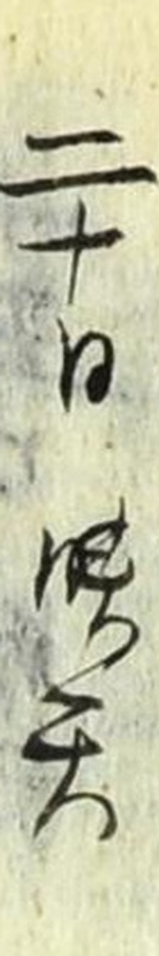二十日晴天
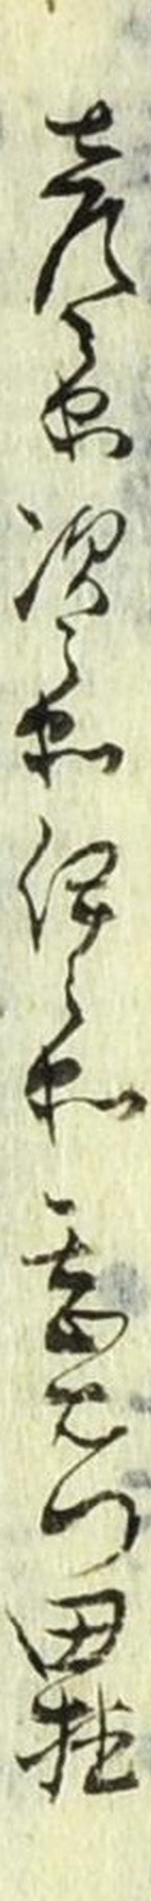彦兵衛次兵衛伊兵衛甚右衛門田植
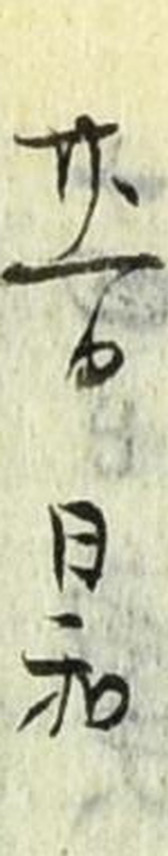廿一日日和
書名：（日記）
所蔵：福井県文書館 Fukui Prefectural Archives
